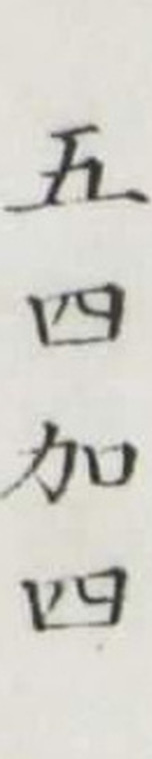五四加四
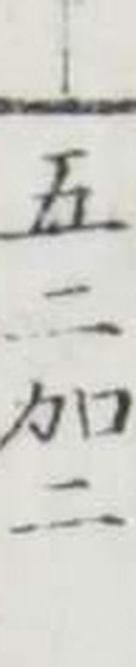五二加二
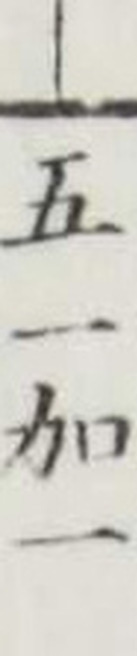五一加一
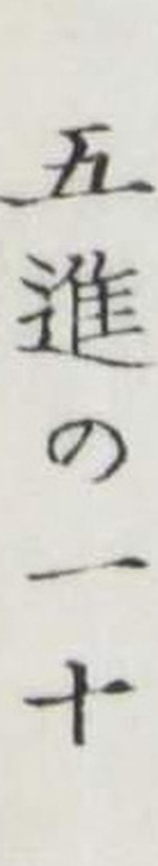五進の一十
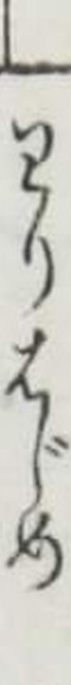わりはじめ
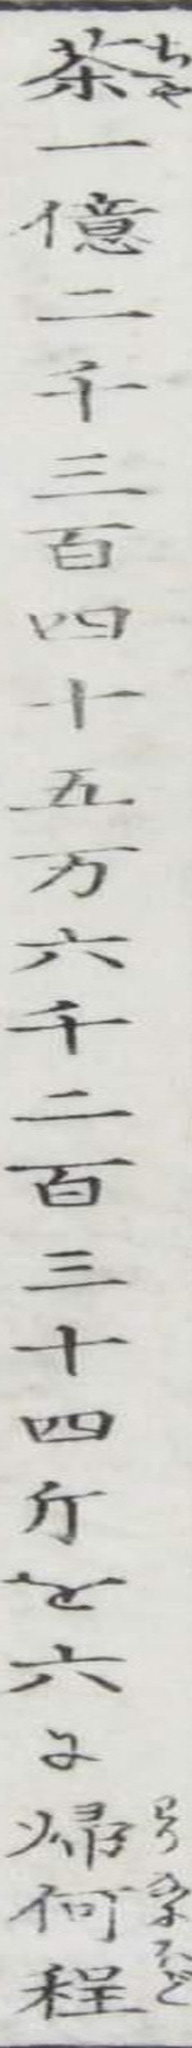茶一億二千三百四十五万六千二百三十四斤を六に帰何程
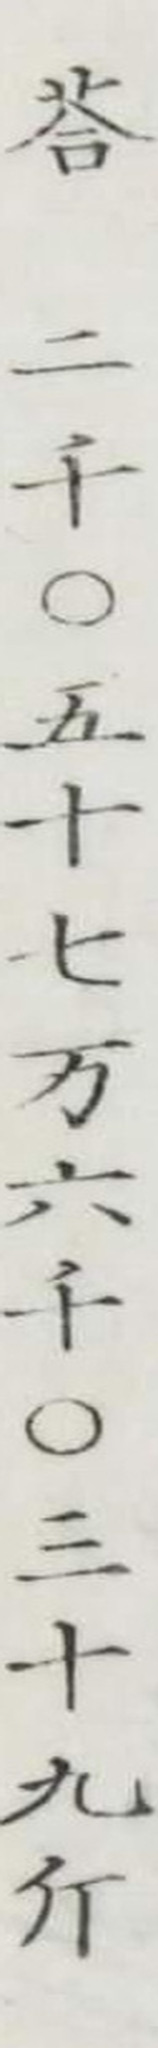答二千〇五十七万六千〇三十九斤
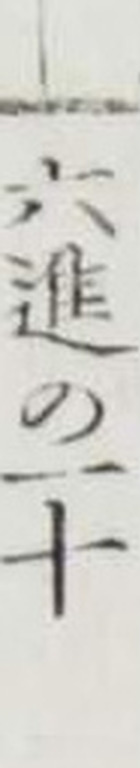六進の一十
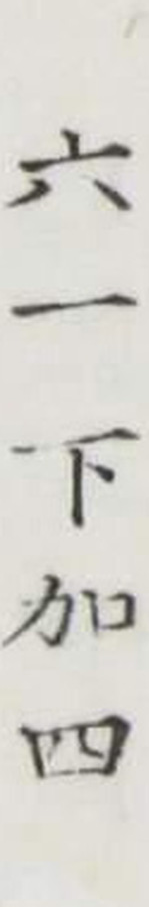六一下加四
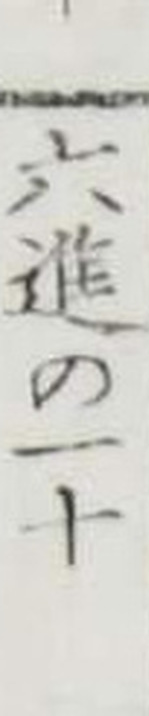六進の一十
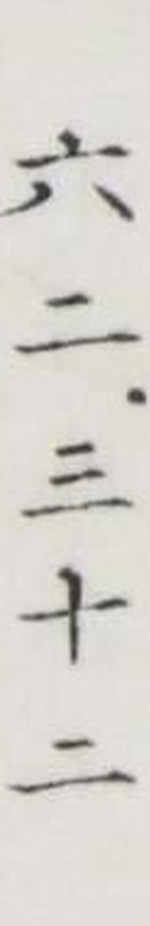六二．三十二
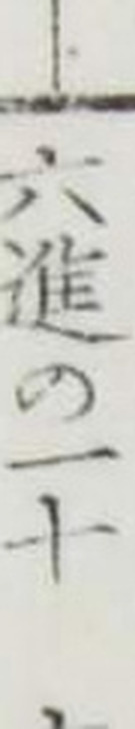六進の一十
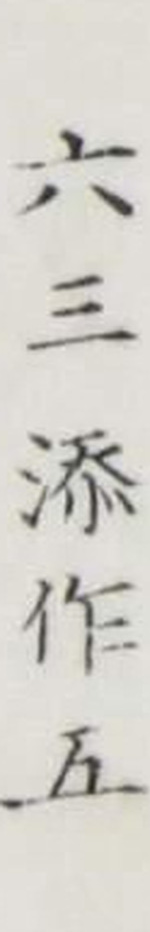六三添作五
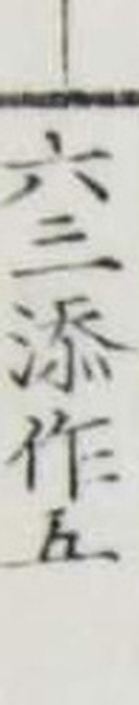六三添作五
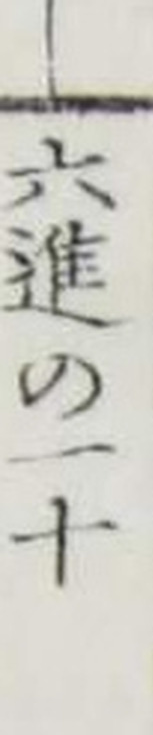六進の一十
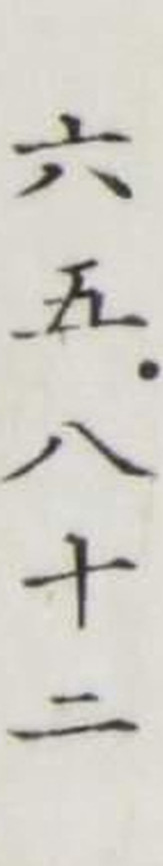六五．八十二
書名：明治小學塵劫記 卷1
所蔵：東京学芸大学教育コンテンツアーカイブ
